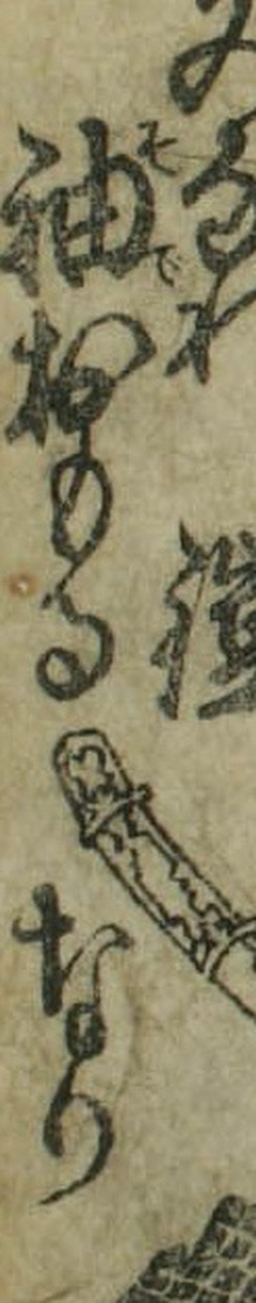袖おもるなり

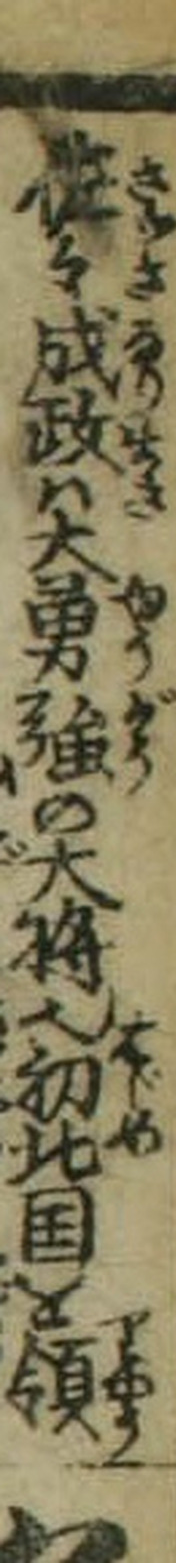佐々成政は大勇強の大将也初北国を領
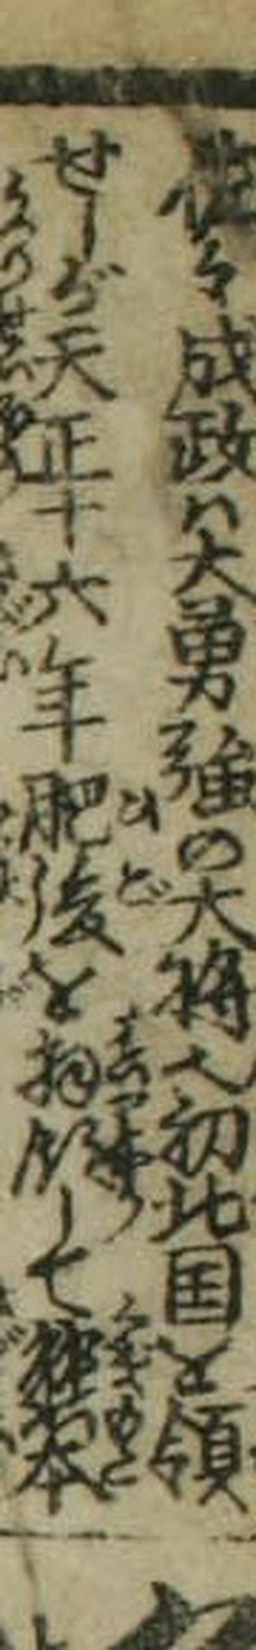せしが天正十六年肥後を拝領して熊本
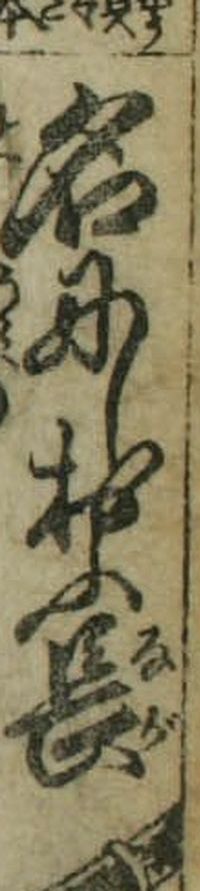名にしおふ長
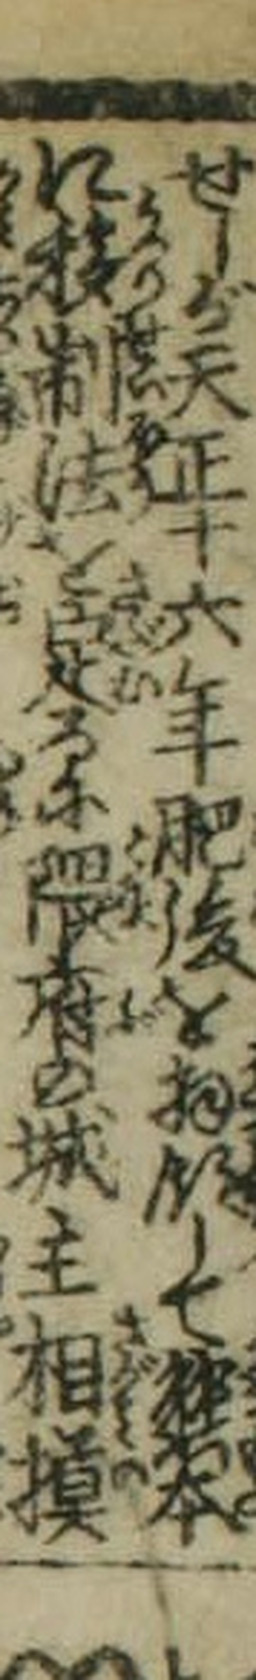に移制法を定るに隈府の城主相摸
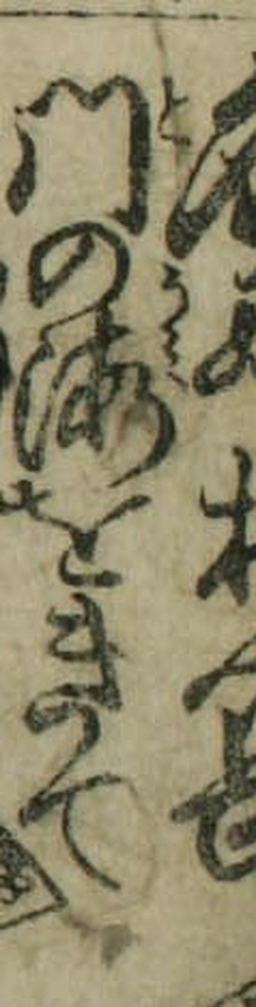門の海をきて
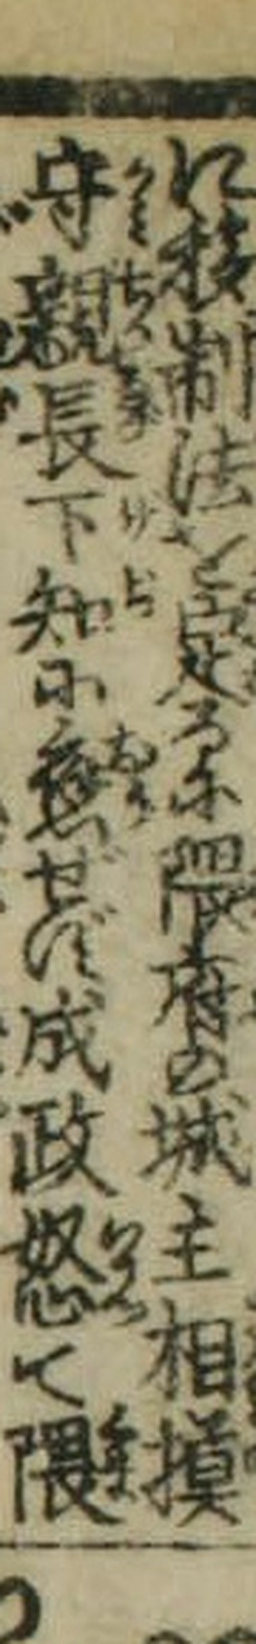守親長下知に応ぜず成政怒て隈
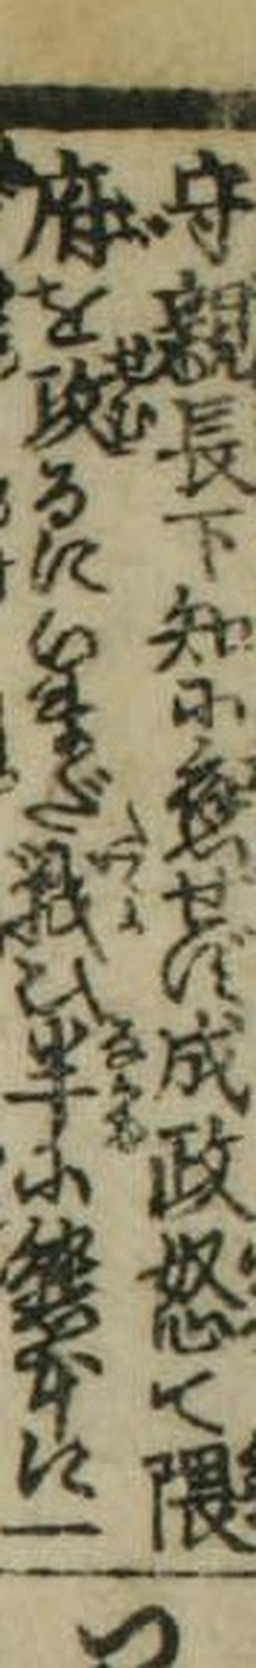府を攻るにいまだ戦ひ半に熊本に一
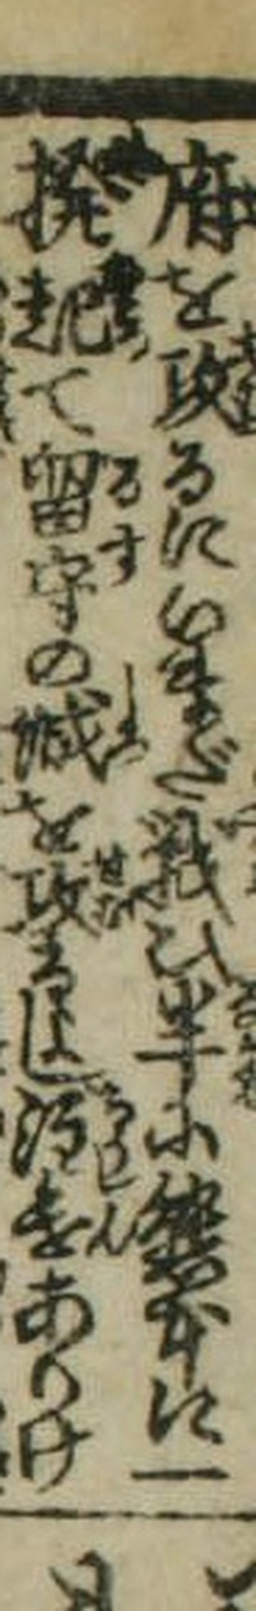揆起て留守の城を攻るよし注進ありけ
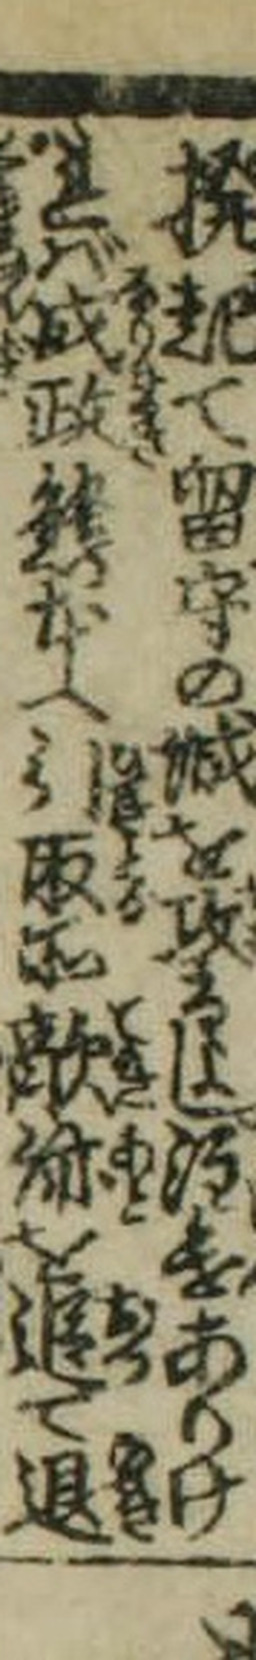れば成政熊本へ引取所歒跡を追て退
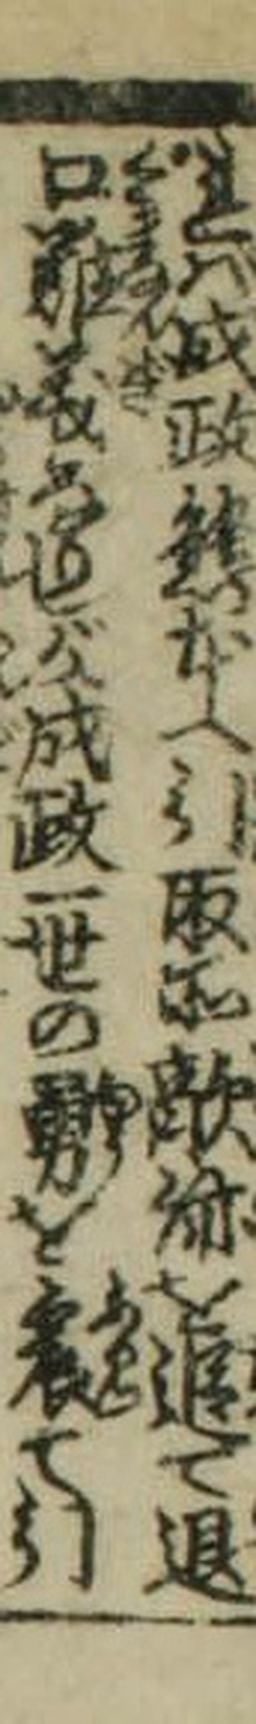口難義なりしが成政一世の勇を震て引
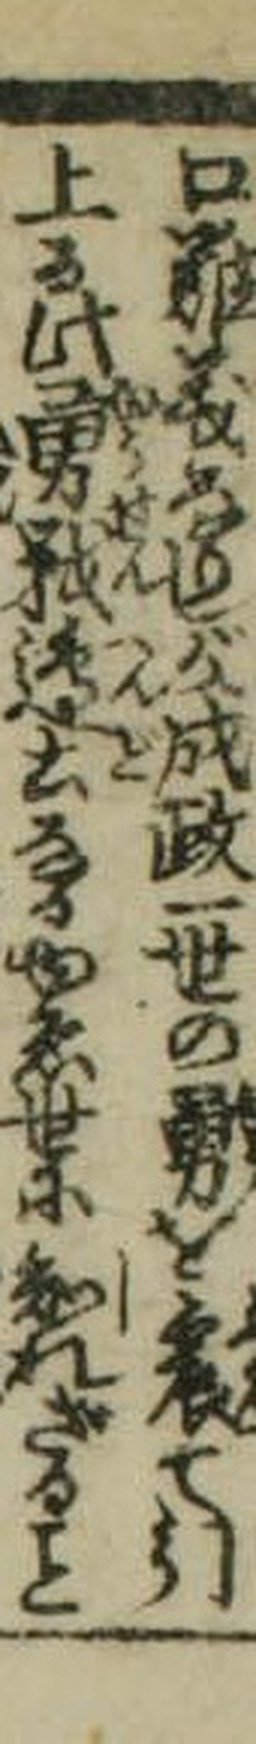上る此勇戦辺土なるゆゑ世に知れざること
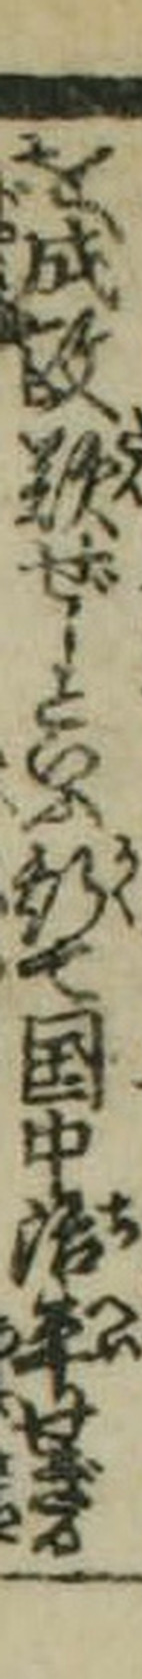を成政歎ぜしといふ斯て国中治平せざる
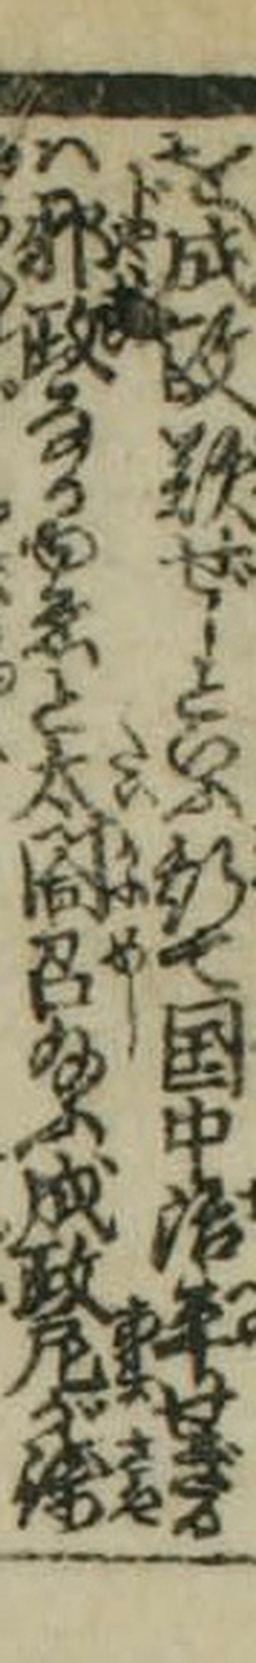は邪政なるゆゑと太閤召給ふ成政尼が崎
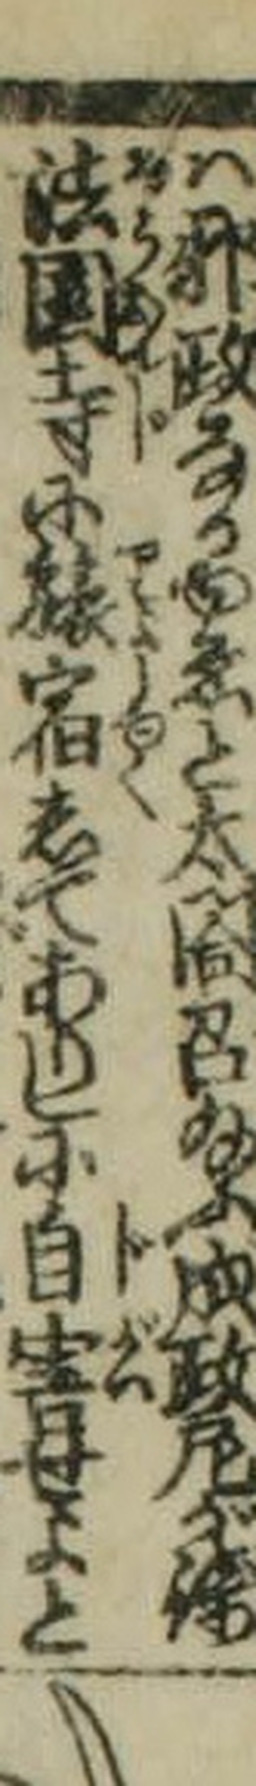法園寺に旅宿してありしに自害せよと
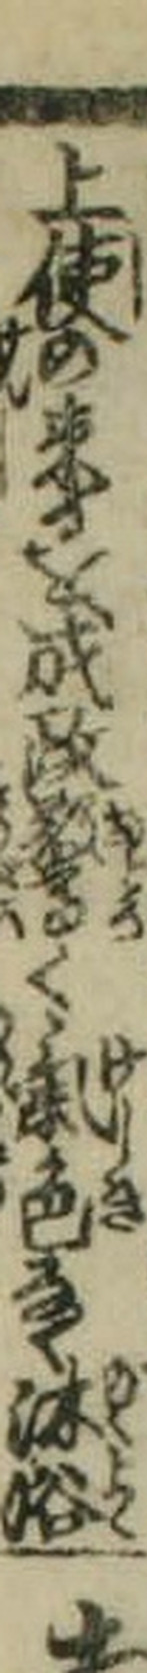上使の来るを成政驚く気色なく沐浴
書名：續英雄百人一首
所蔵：東京学芸大学附属図書館
